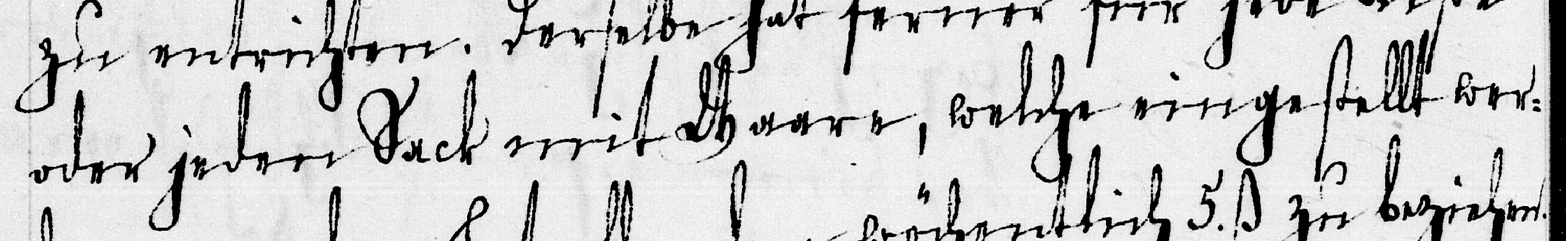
oder jeden Sack mit Waare, welche eingestellt wer¬
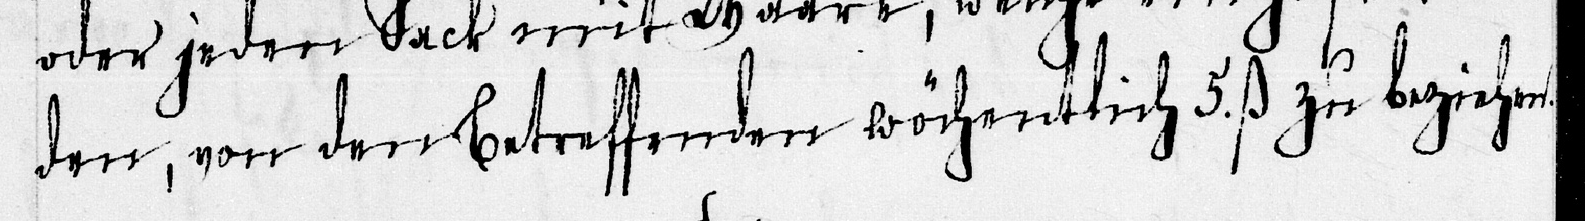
den, von den Betreffenden wöchentlich 5. ß. zu beziehen.
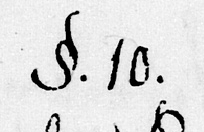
§. 10.
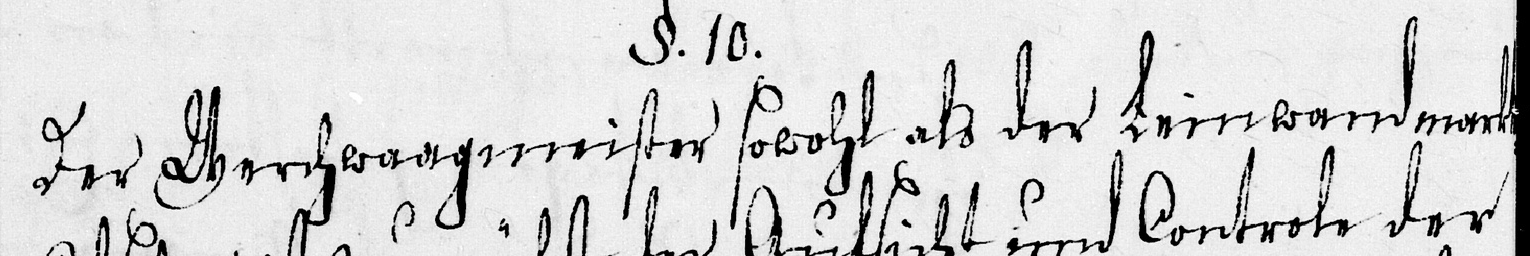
Der Werchwaagmeister sowohl als der Leinwandmark¬
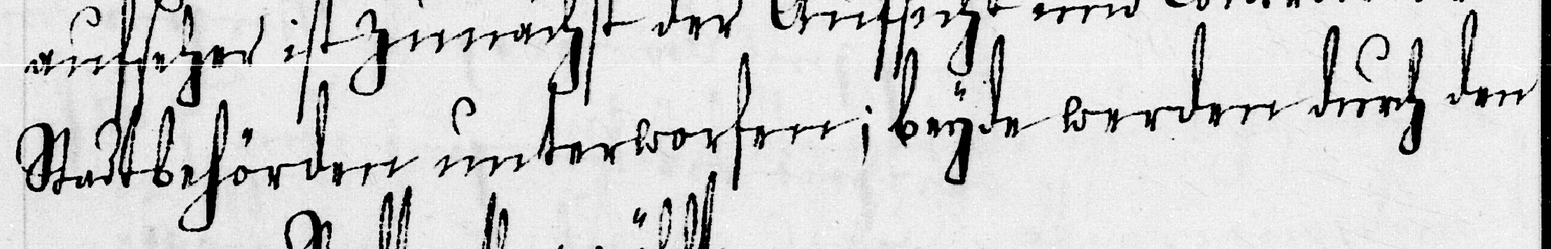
Stadtbehörde unterworfen; beyde werden durch den
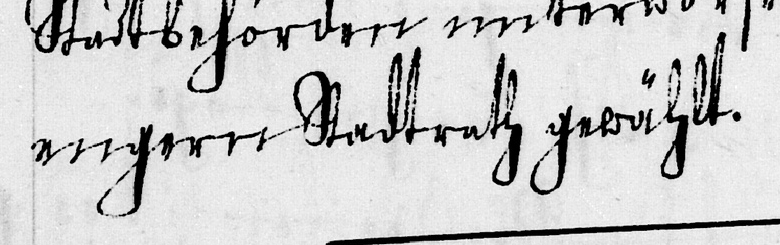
engern Stadtrath gewählt.
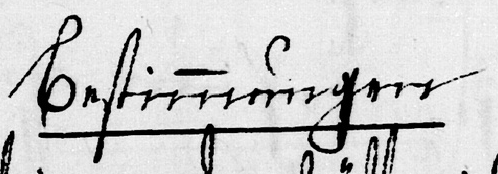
Bestimmungen
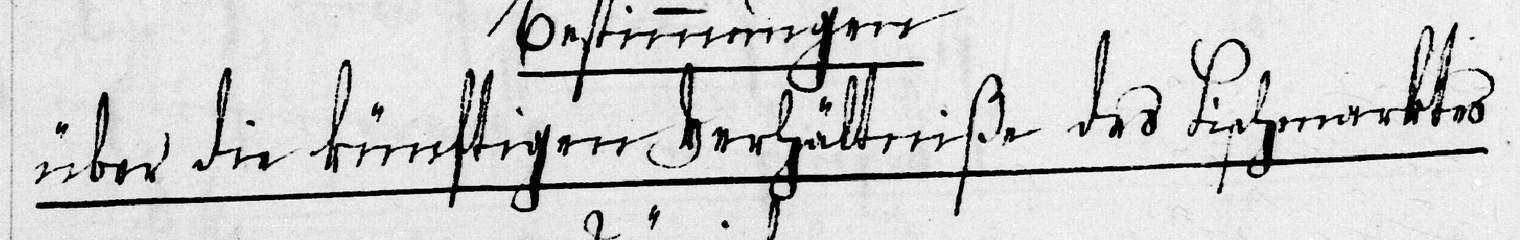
über die künftigen Verhältniße des Fischmarktes
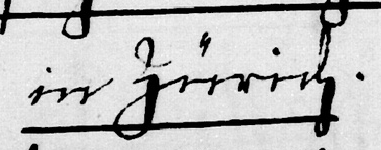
in Zürich.
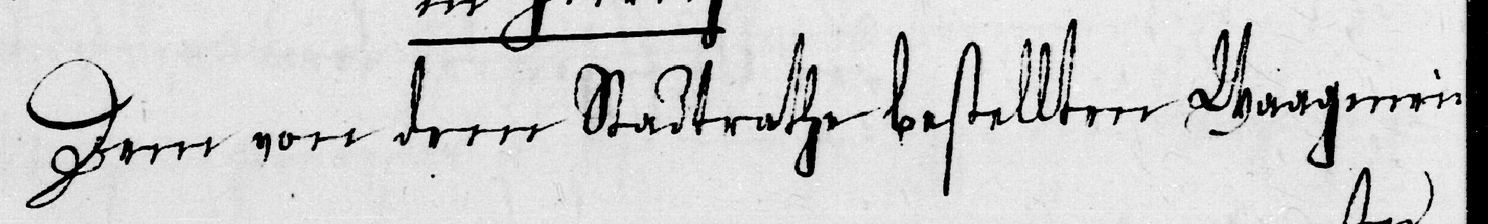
Dem von dem Stadtrathe bestellten Waagmei-
